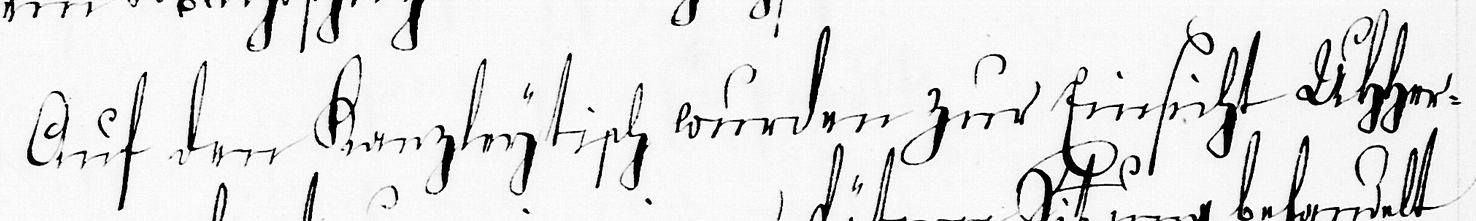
Auf den Kanzleytisch wurden zur Einsciht UHHer¬
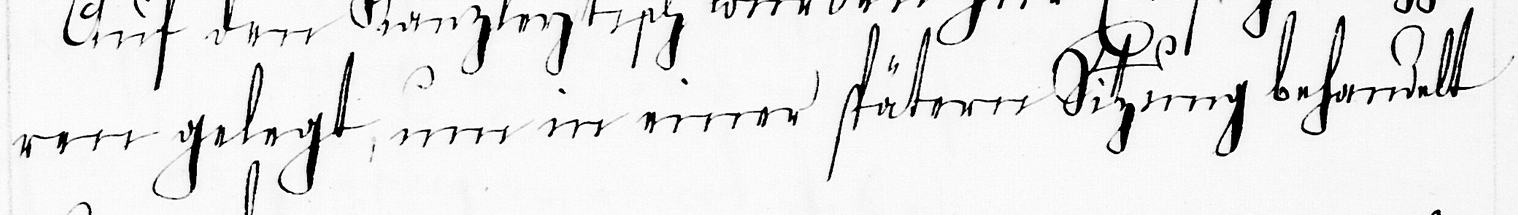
ren gelegt, um in einer spätern Sitzung behandelt
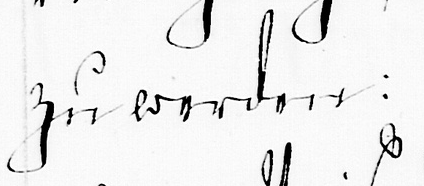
zu werden:
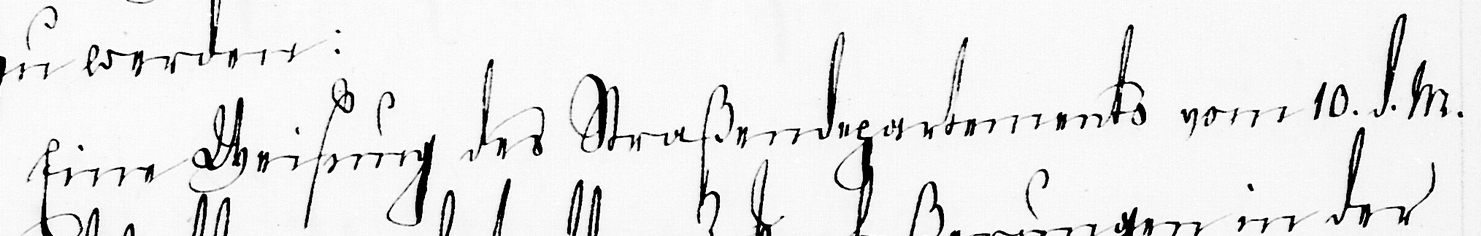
Eine Weisung des Straßendepartements vom 10. d. M.
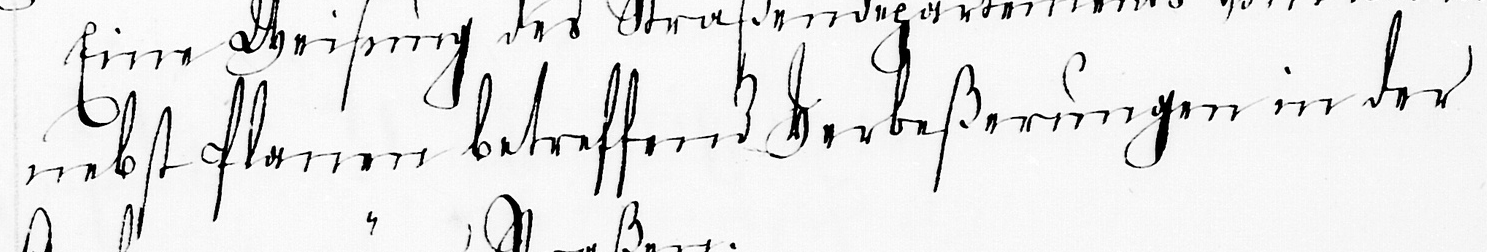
nebst Planen betreffend Verbeßerung in der
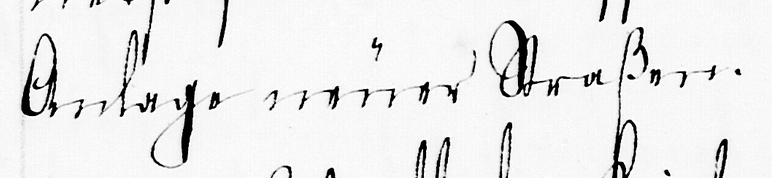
Anlage neuer Straßen.
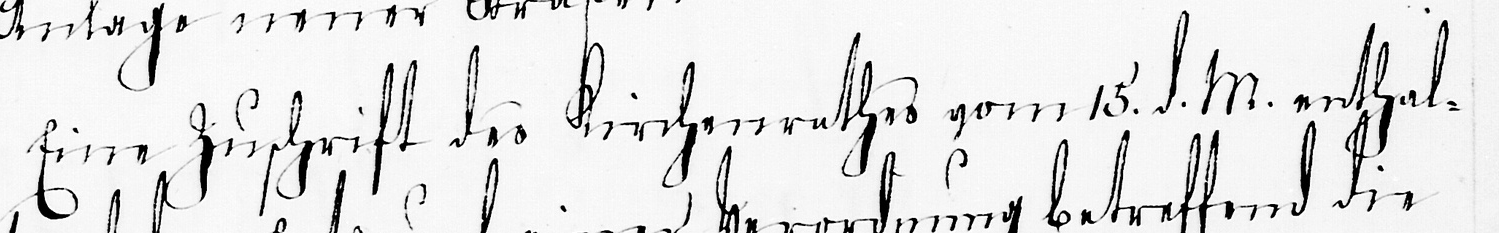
Eine Zuschrift de Kirchenrathes vom 15. d. M. enthal¬
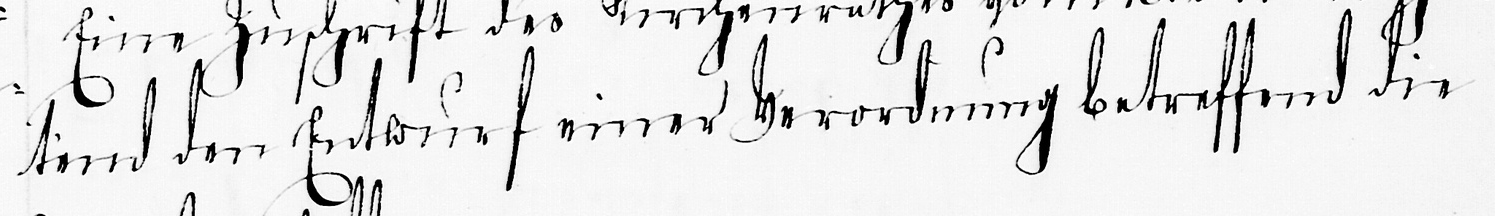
tend den Entwurf einer Verordnung betreffend die
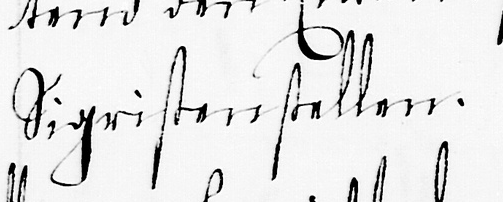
Sigristenstellen.
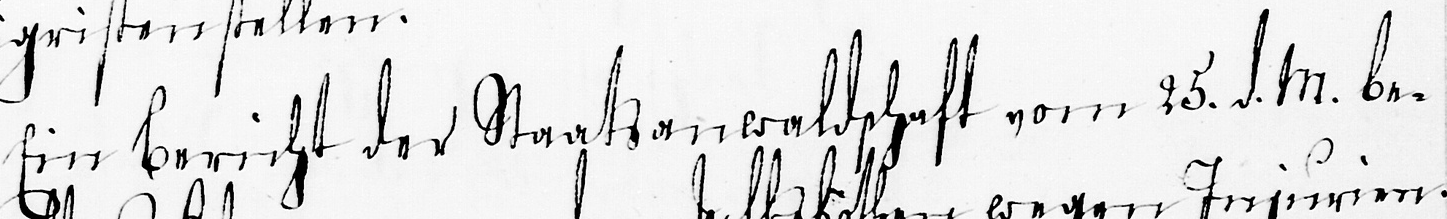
Ein Bericht der Staatsanwaldschaft vom 25. d. M. be¬
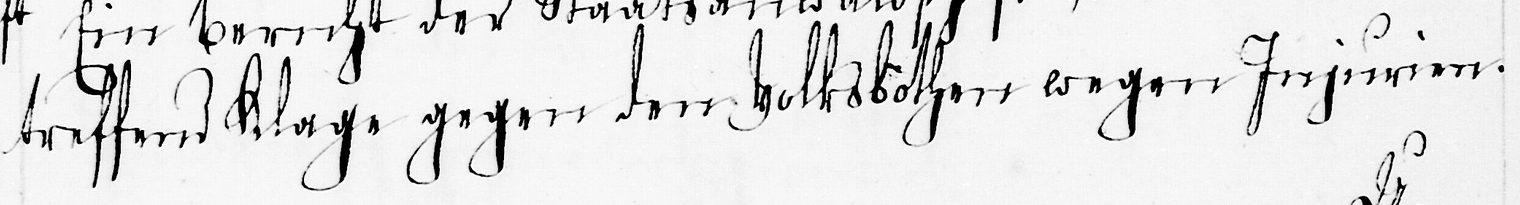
treffend Klage gegen den Volksbothen wegen Injurien.
